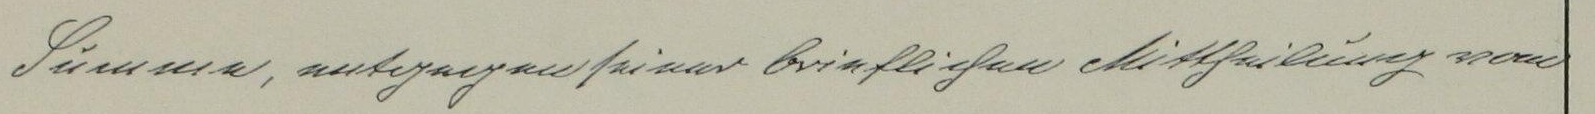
Summe, entgegen seiner brieflichen Mittheilung vom
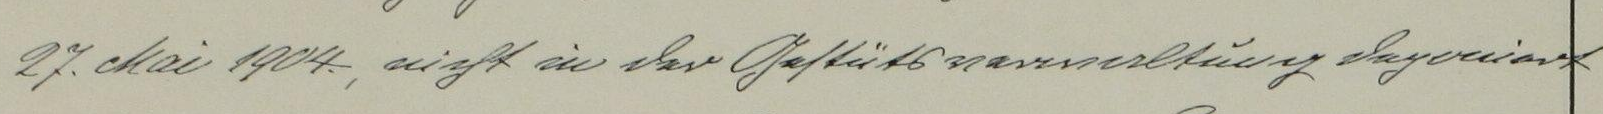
27. Mai 1904, nicht in der Gestütsverwaltung deponiert
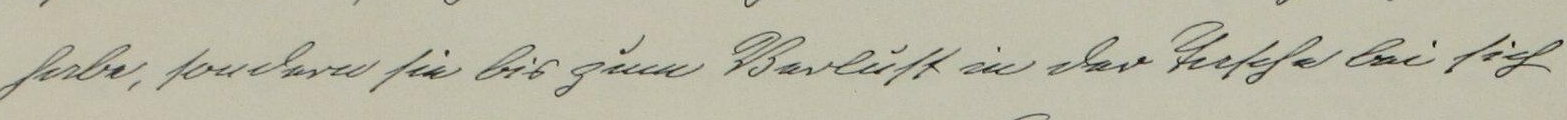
habe, sondern sie bis zum Verlust in der Tasche bei sich
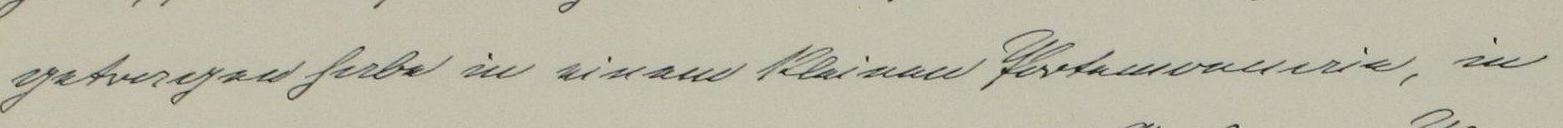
getragen habe in einem kleinen Portemonnaie, in
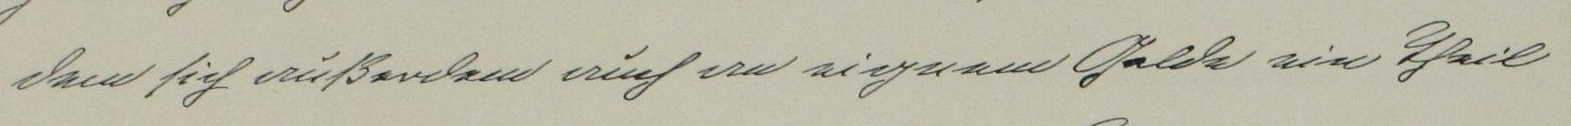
dem sich außerdem auch an eigenem Gelde ein Theil
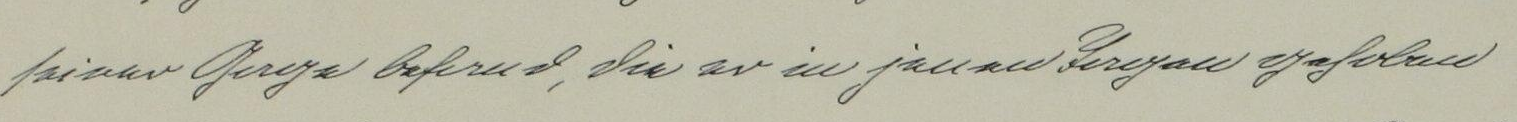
seiner Gage befand, die er in jenen Tagen gehoben
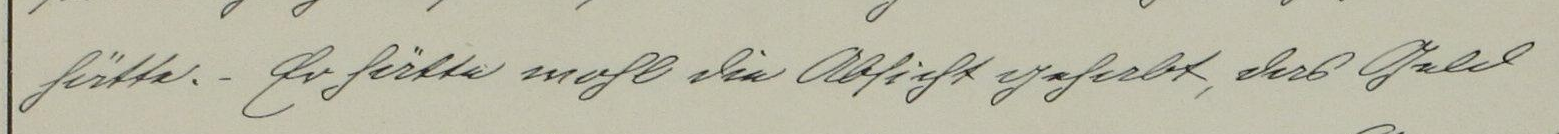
hätte. – Er hätte wohl die Absicht gehabt, das Geld
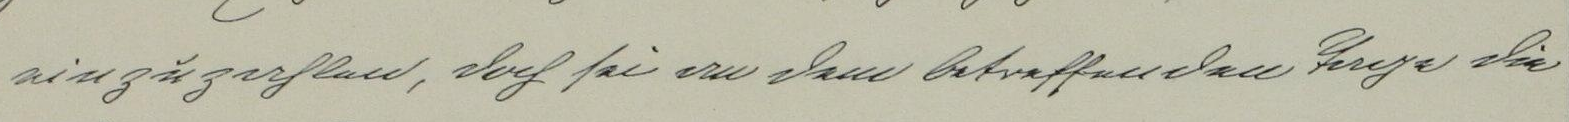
einzuzahlen, doch sei an dem betreffenden Tage die
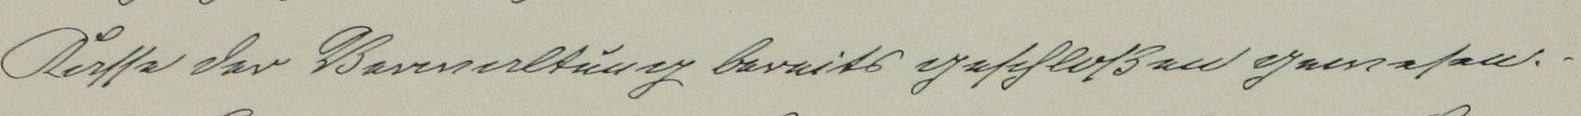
Kasse der Verwaltung bereits geschloßen gewesen.
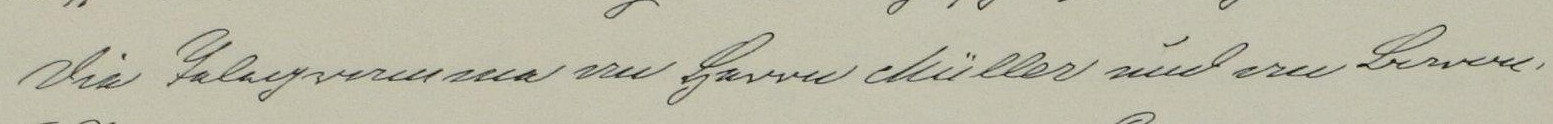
Die Telegramme an Herrn Müller und an Baron
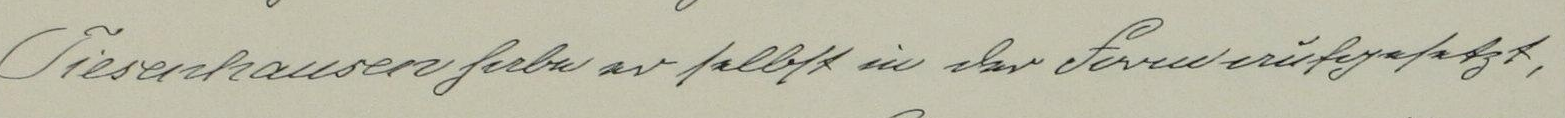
Tiesenhausen habe er selbst in der Form aufgesetzt,
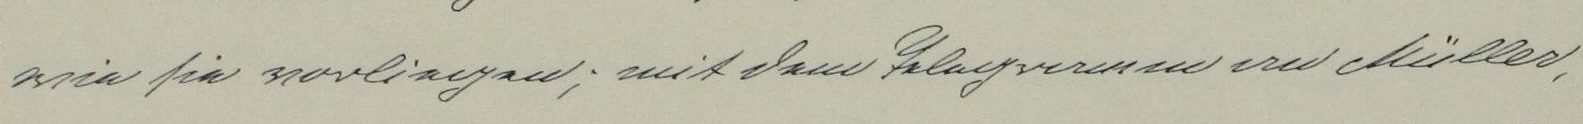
wie sie vorliegen; mit dem Telegramm an Müller,
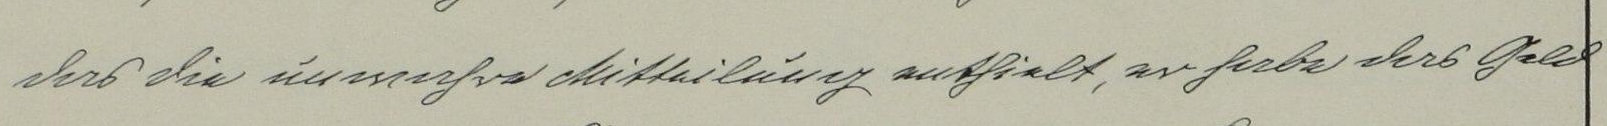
das die unwahre Mitteilung enthielt, er habe das Geld
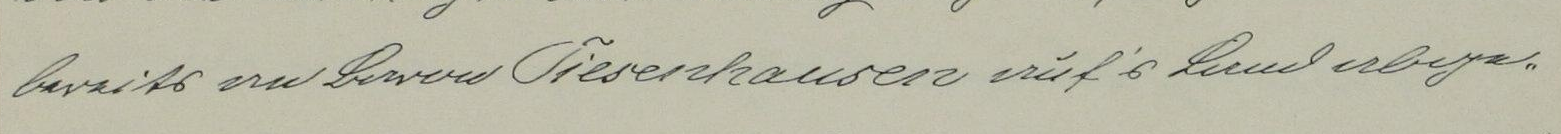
bereits an Baron Tiesenhausen aufʼs Land abge-
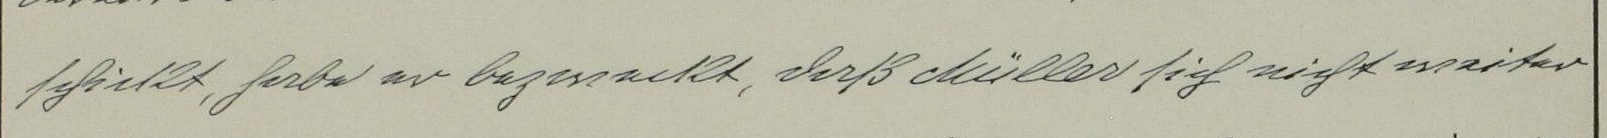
schickt, habe er bezweckt, daß Müller sich nicht weiter
